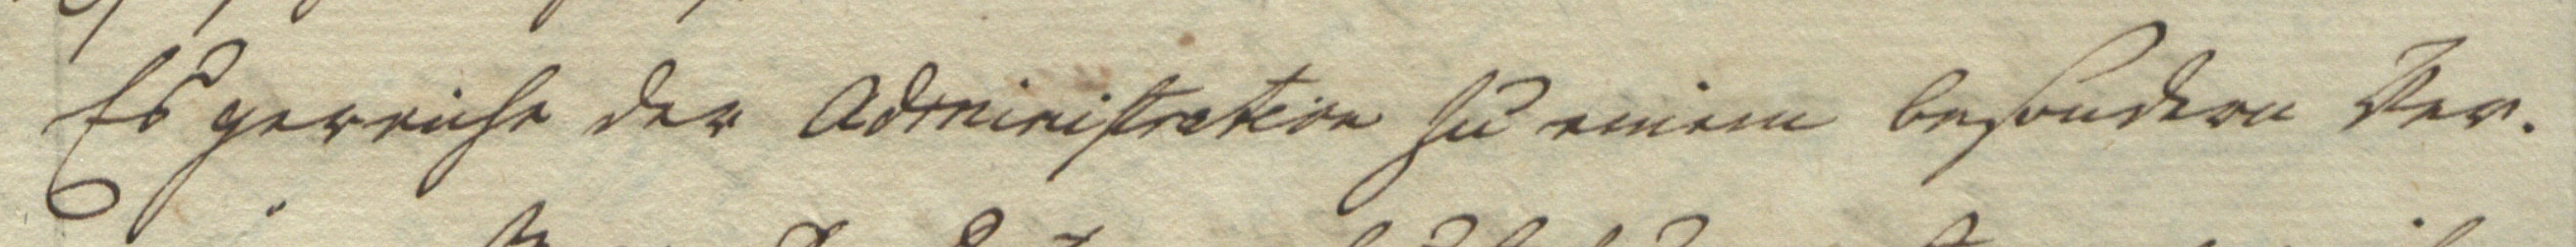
Es gereiche der Administration zu einem besondern Ver¬
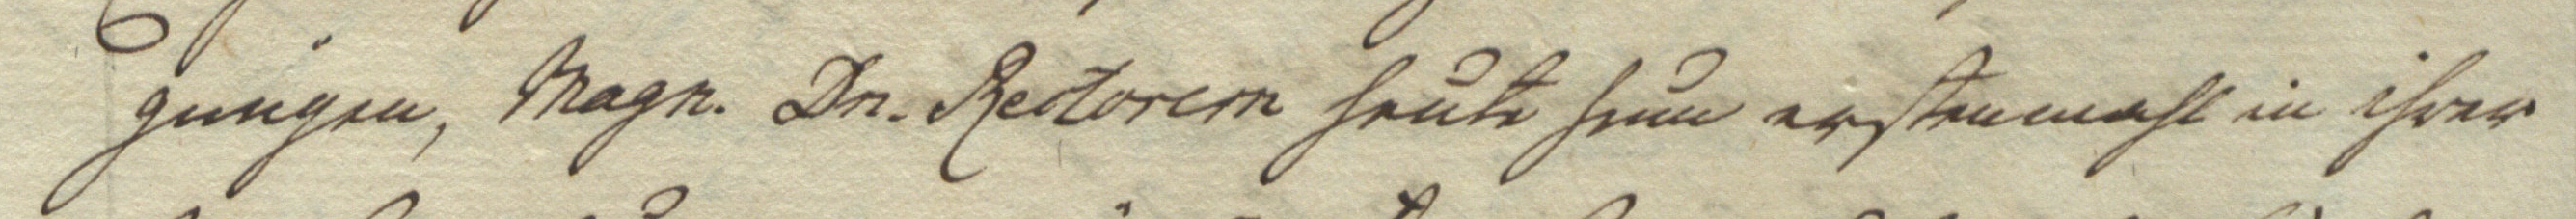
gnügen, Magn. Dn. Rectorem heute zum erstenmahl in ihrer
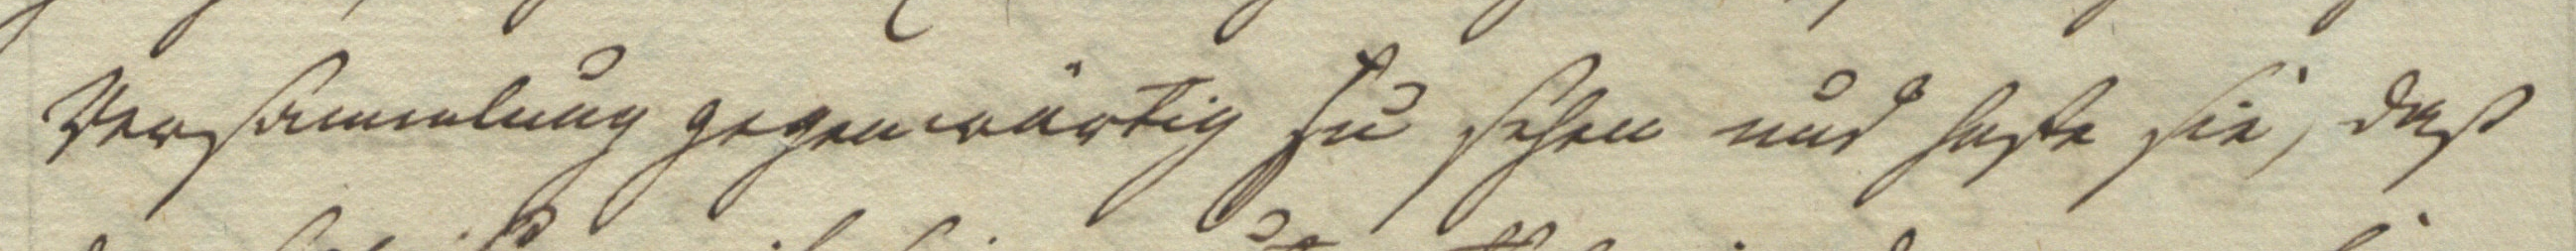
Versammlung gegenwärtig zu sehen und hoffe sie, daß
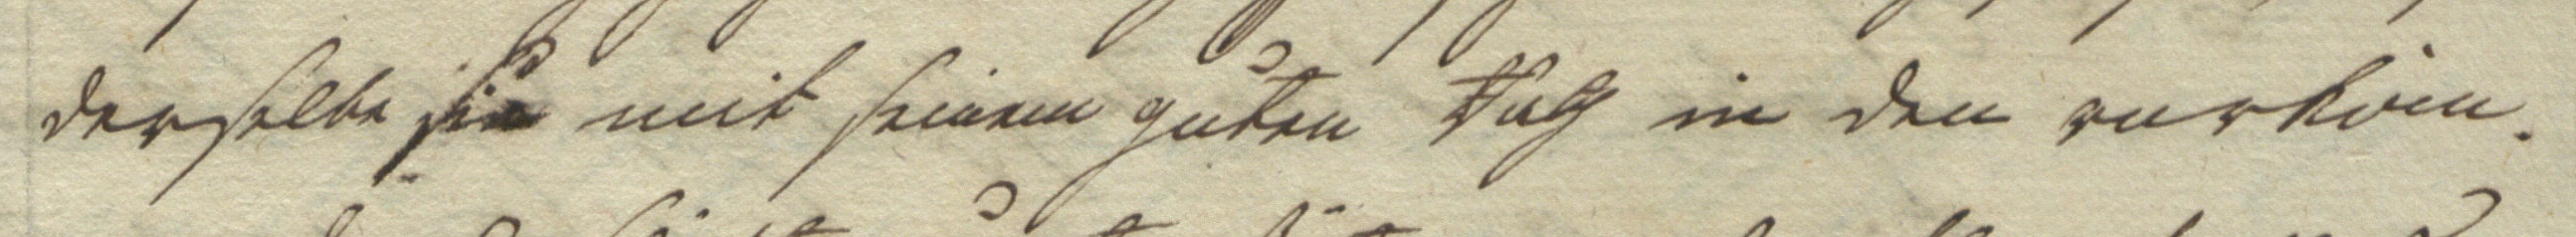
derselbe sie mit seinem guten Rath in den vorkom¬
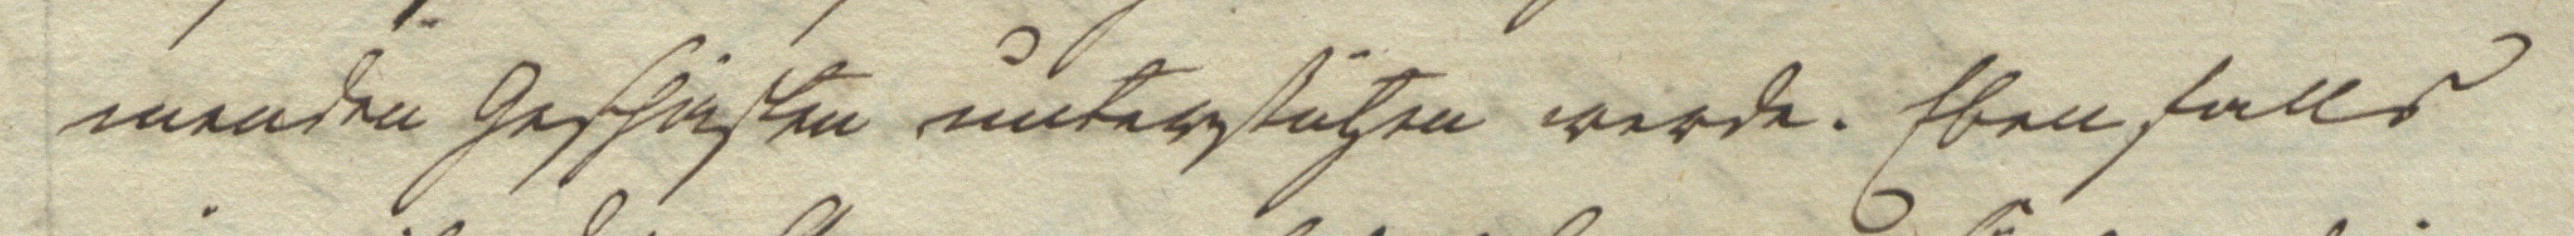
menden Geschäften unterstützen werde. Ebenfalls
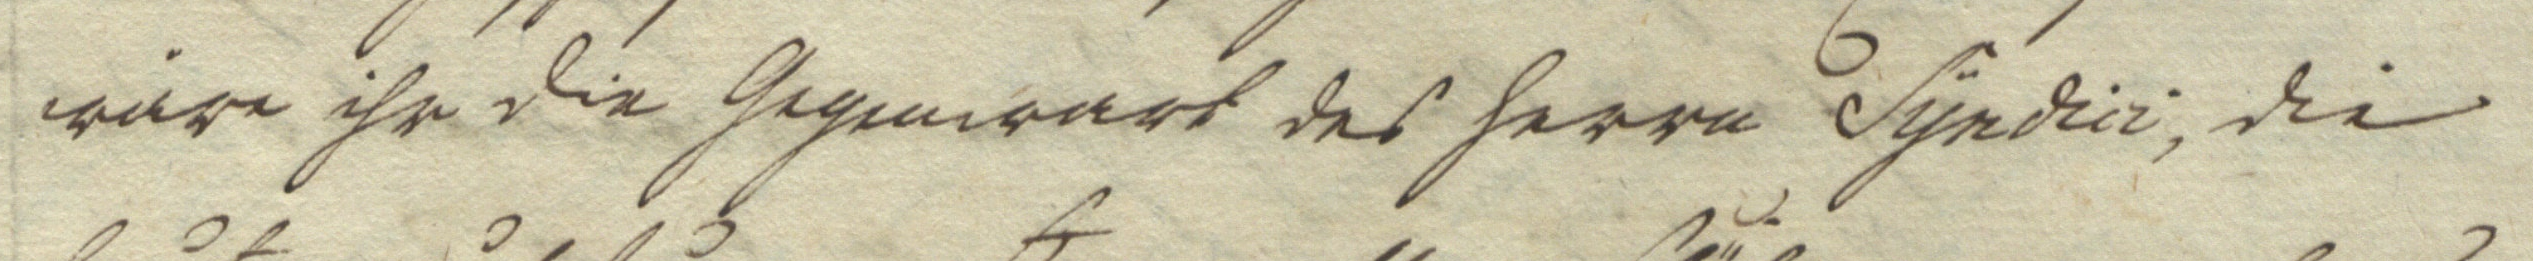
wäre ihr die Gegenwart des Herrn Syndici, die
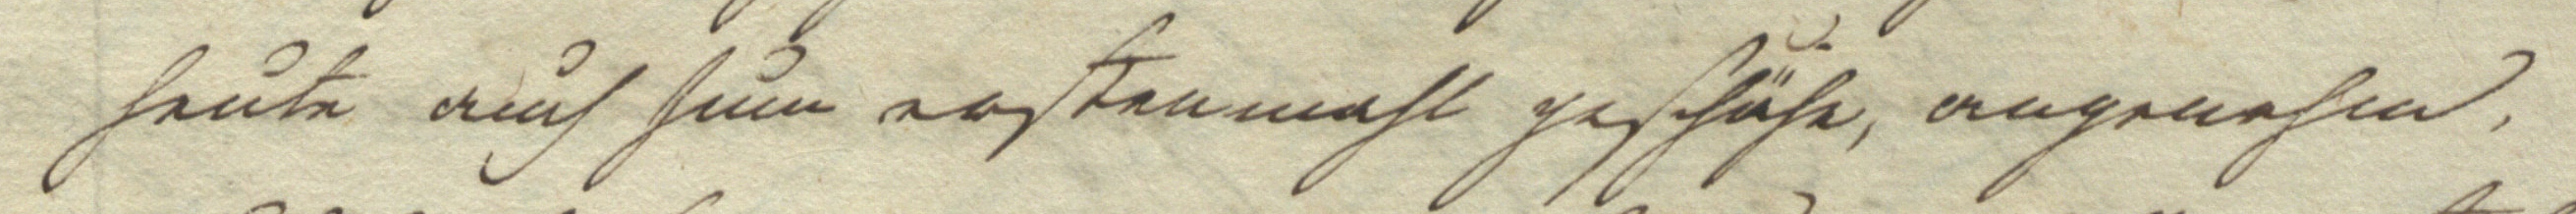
heute auch zum erstenmahl geschähe, angenehm,
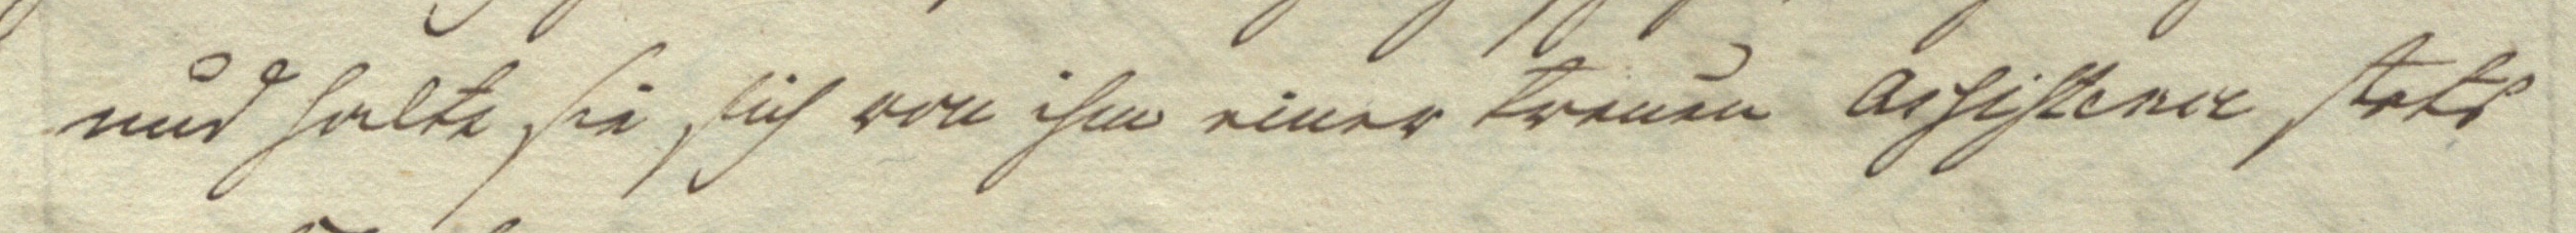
und halte sie sich von ihm einer treuen Assistence stets
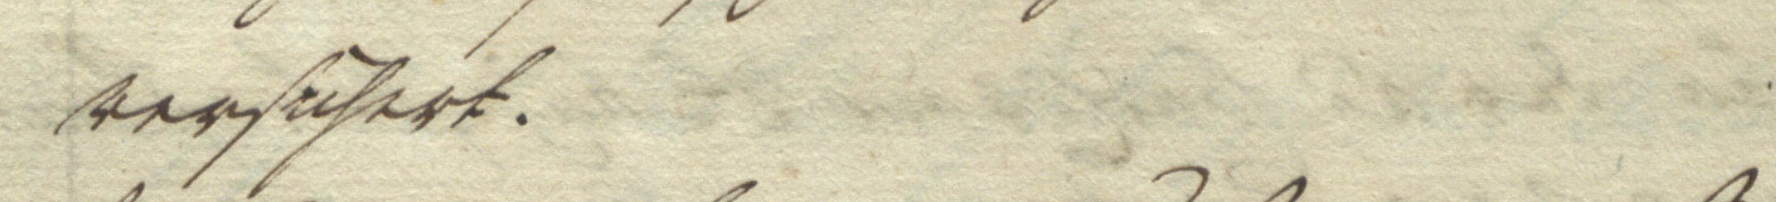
versichert.
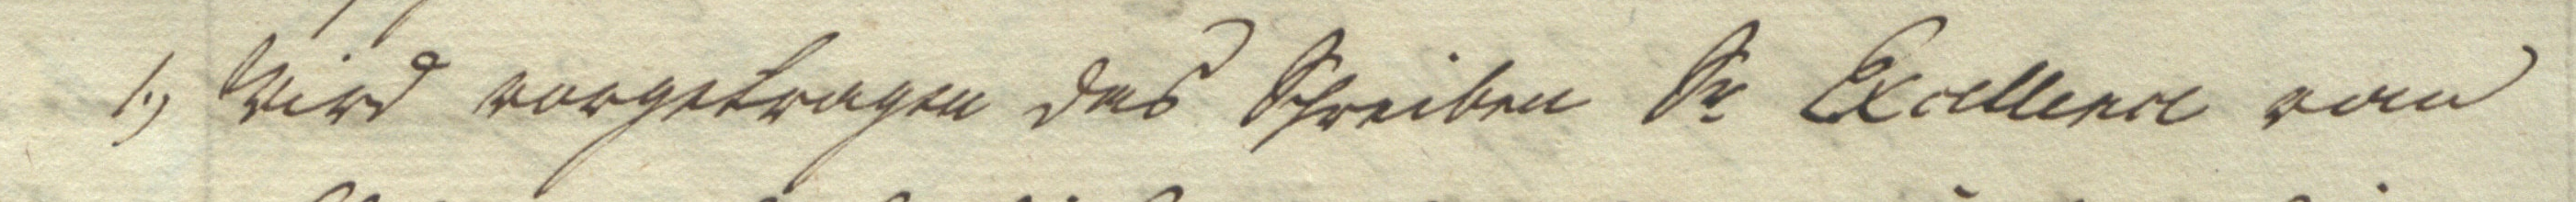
1., wird vorgetragen das Schreiben Sr. Excellence vom
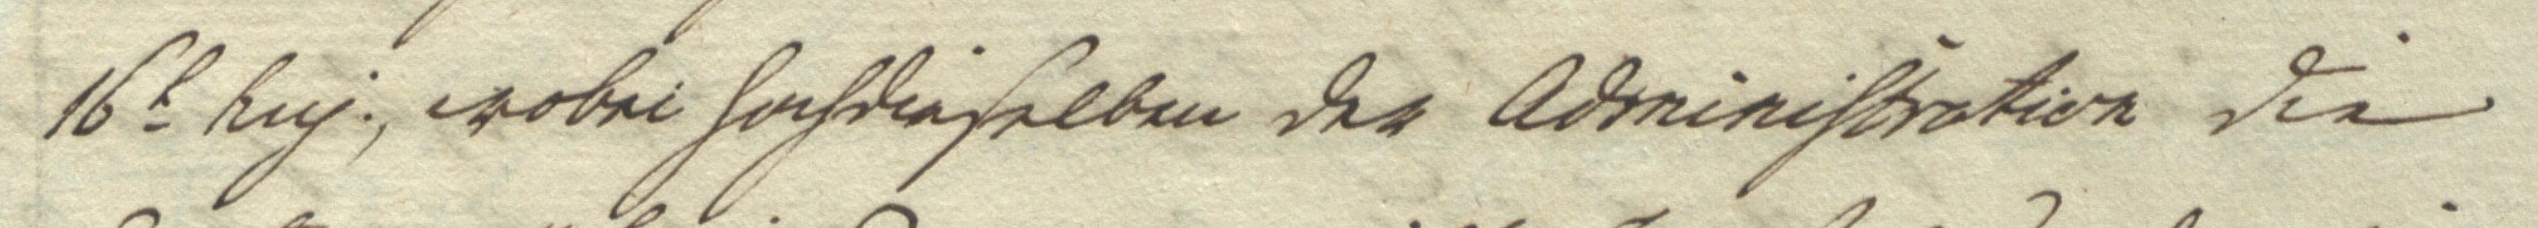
16t huj., wobei hochdieselben der Administration die
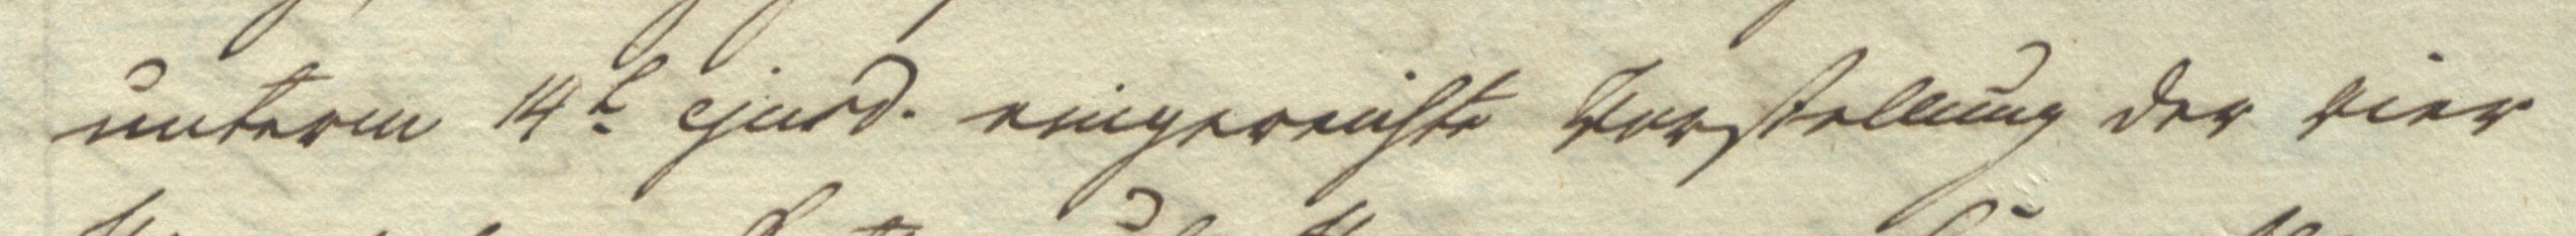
unterm 14t. ejusd. eingereichte Vorstellung der vier
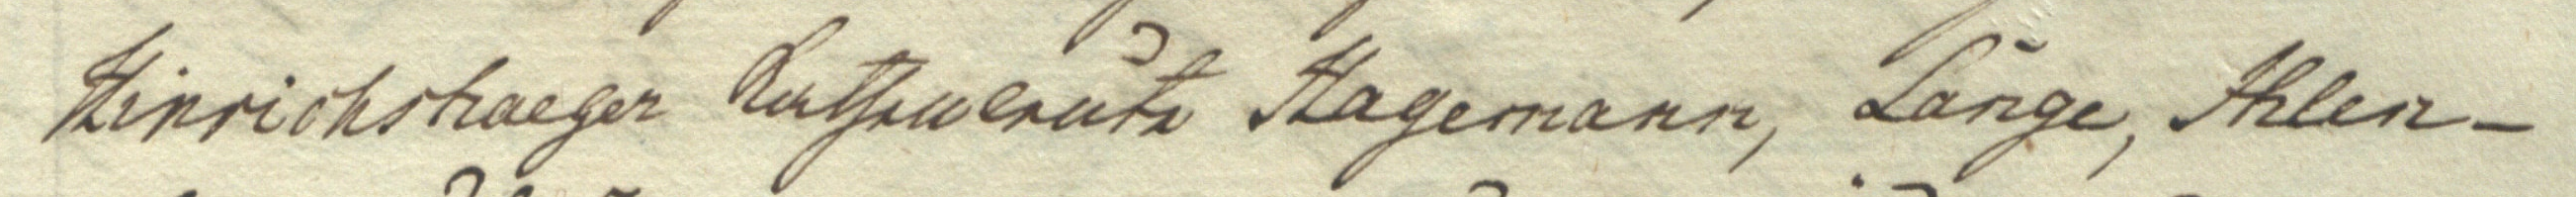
Hinrichshaeger Kathenleute Hagemann, Lange, Ihlen¬
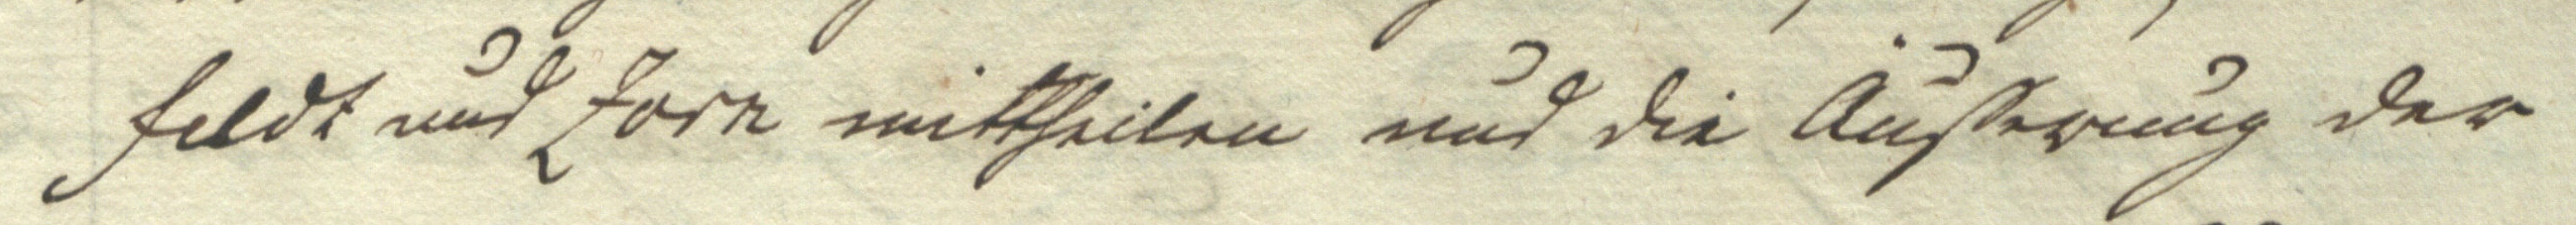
feldt und Zorn mittheilen und die Äusserung der
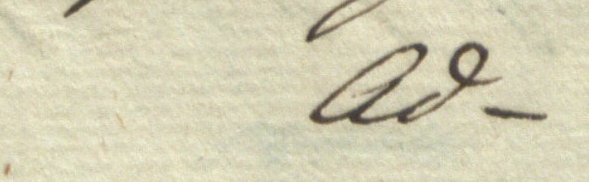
Ad¬
